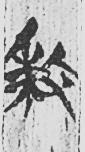殺
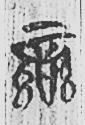{絲言}
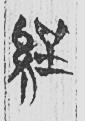{糸呈}
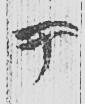于
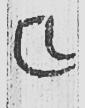曲
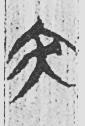夭
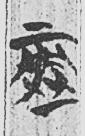坪
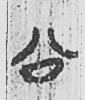公
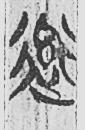{行幺止}
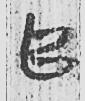𠂤
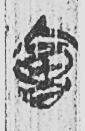會
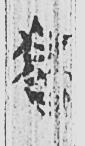者
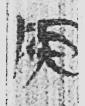侯
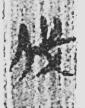伐
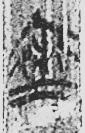齊
